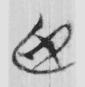臣
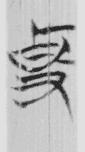史
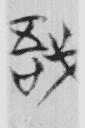{吾戈}
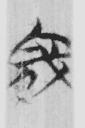{完戈}
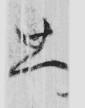也
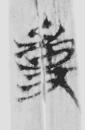尃
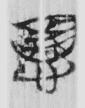{囗者心}
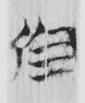於
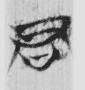君
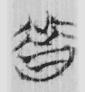昔
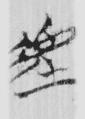𫊟
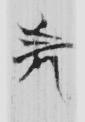先
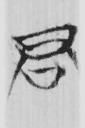君
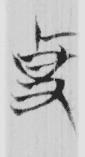史
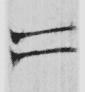二
